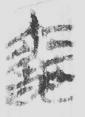{尒䎽}
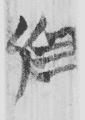於
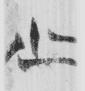少
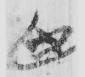臣
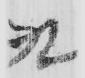九
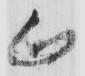㠯（以）
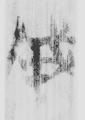成
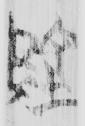地
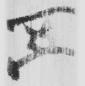五
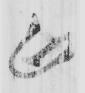㠯（以）
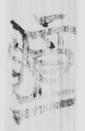{𨟻止}
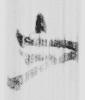之
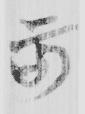可
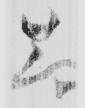也
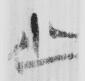少
